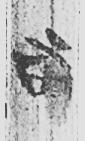右
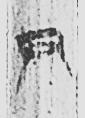尹
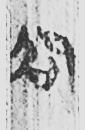卲
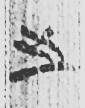之
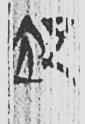{立巳}
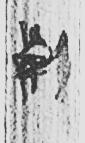死
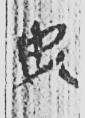𡚦
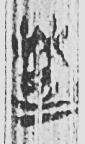楚
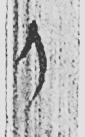人
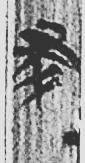𦘔
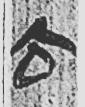{勹厶}
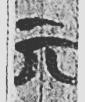亓
